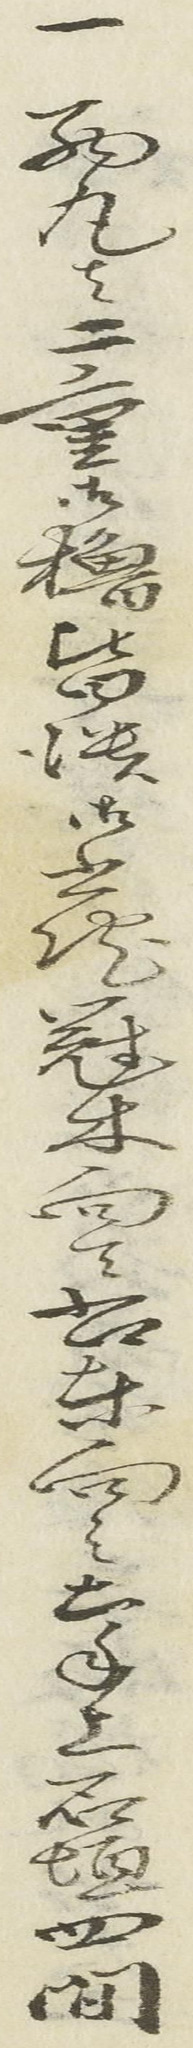一西丸は二重御櫓皆潰御書院冠木向は右東向之土手上石垣四間
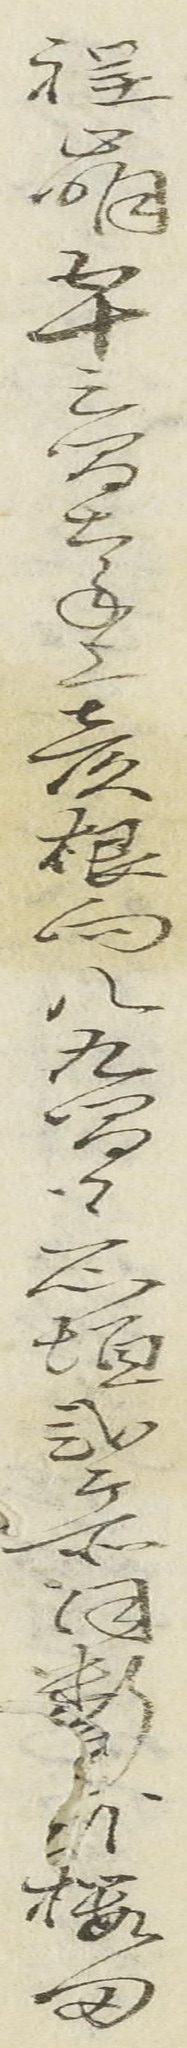程崩五十三間土手上彦根向八九間ツゝ石垣弐ヶ所同断外
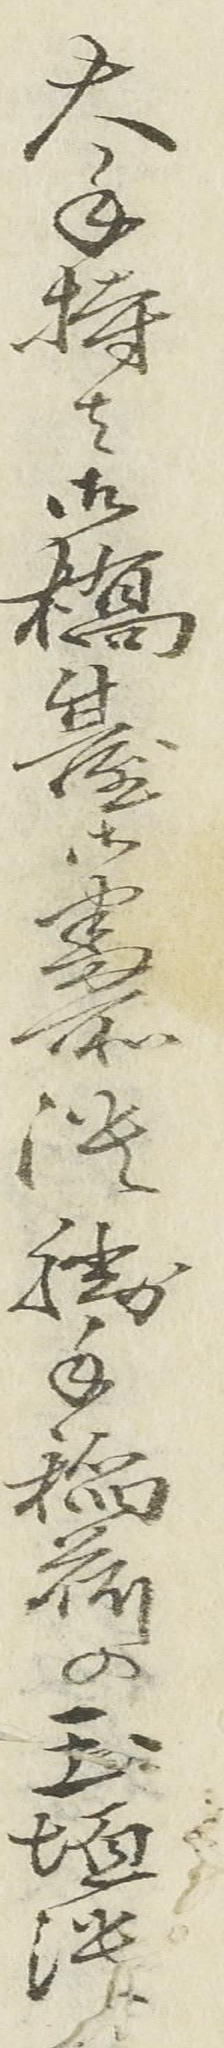大手持は御橋臺御番所潰勝手稲荷の玉垣潰
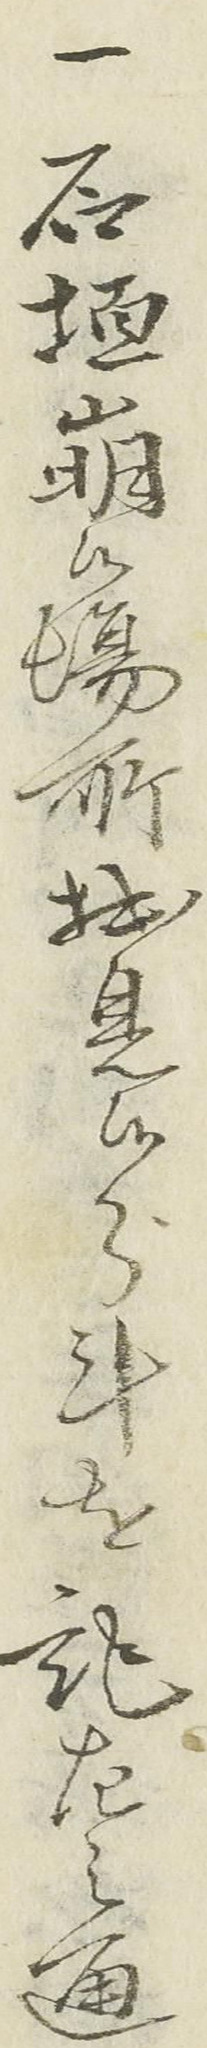一石垣崩候場所拙見候分斗を記左之通

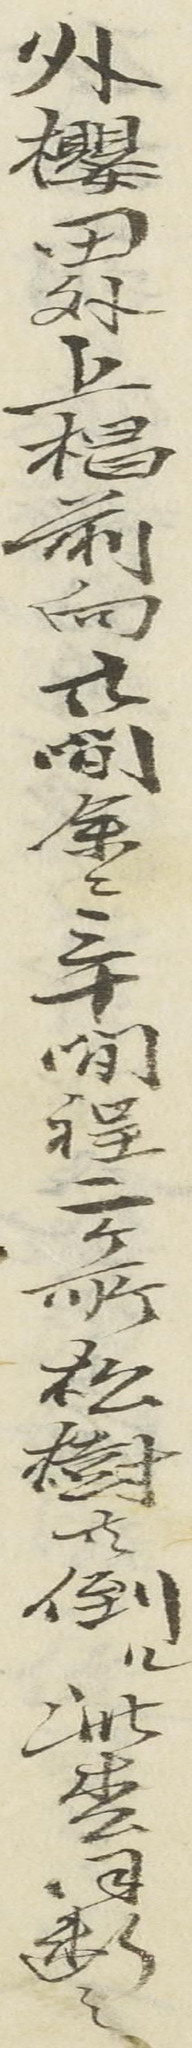外桜田外上椙前向廿間余ニ三十間程二ヶ所松樹共倒ル此枩同断
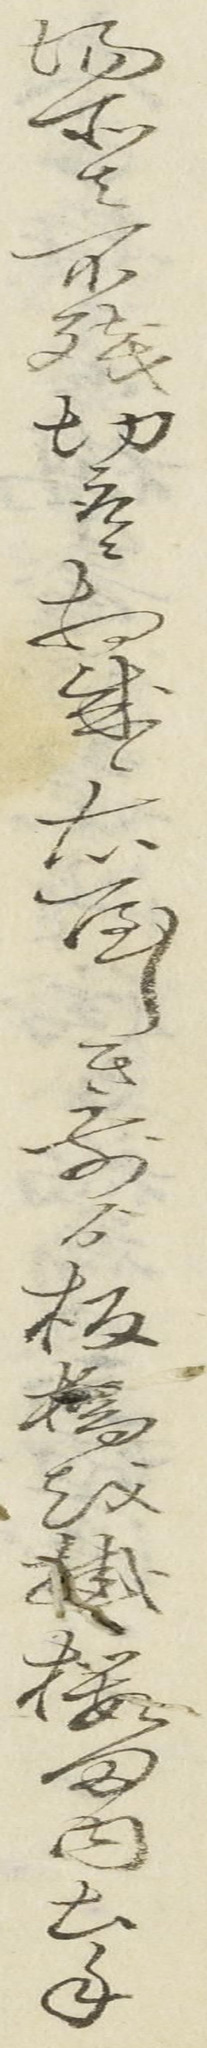場所は不残切取ニ相成候右屋しき前ゟ板橋越掛桜田内土手
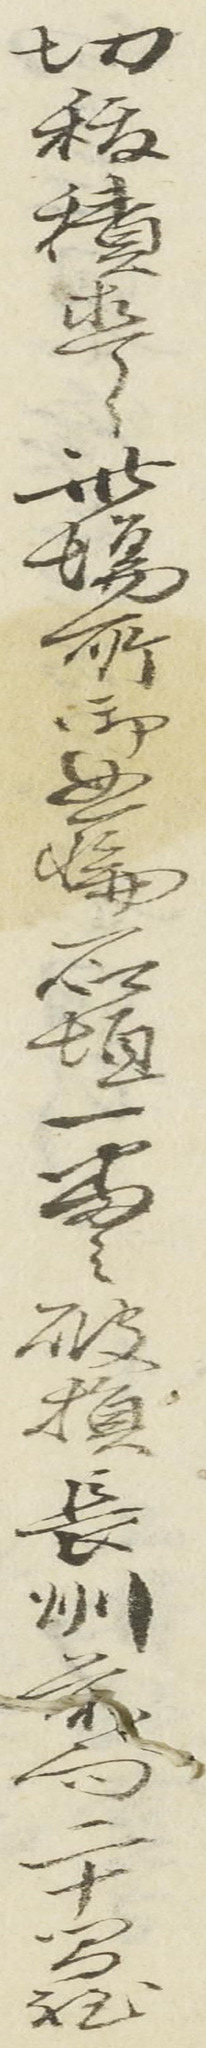切抜積直し此場所御曲輪石垣一番之破損長州前向二十間程
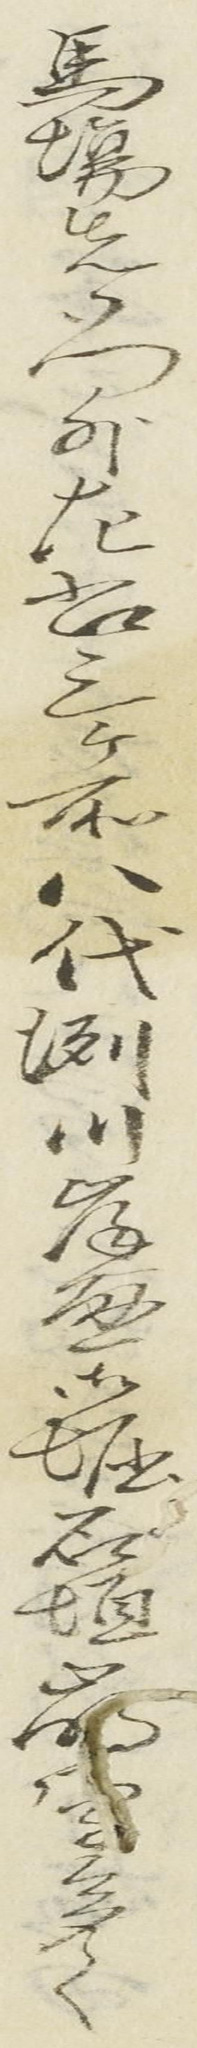馬場先御門外左右三ヶ所八代洲川岸通御堀石垣崩孕多く
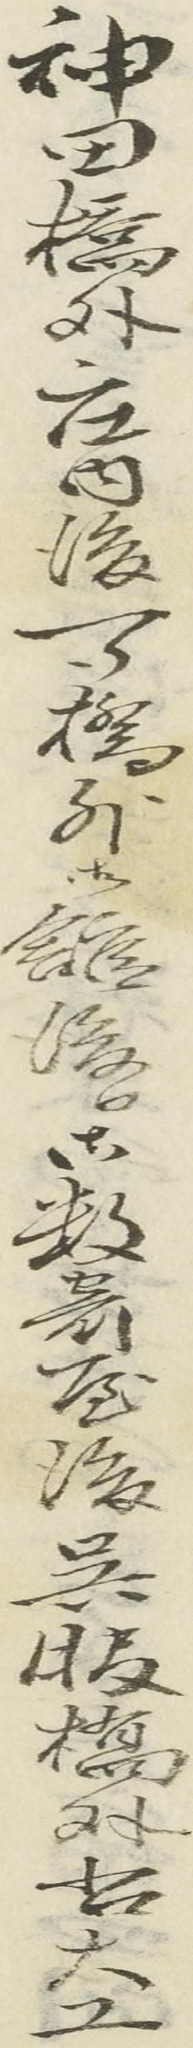神田橋外庄内後一ッ橋外御館後口御数寄屋後呉服橋外右大工
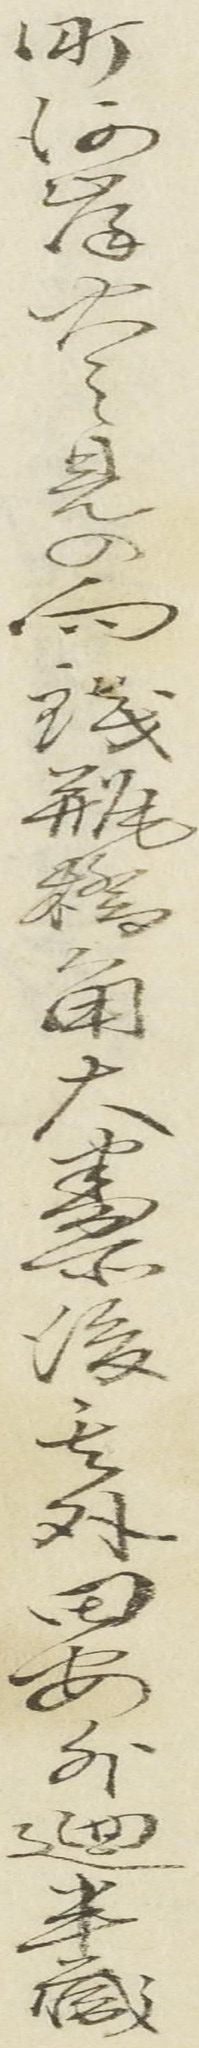町河岸火之見の向銭瓶橋角大番所後其外田安外廻半蔵
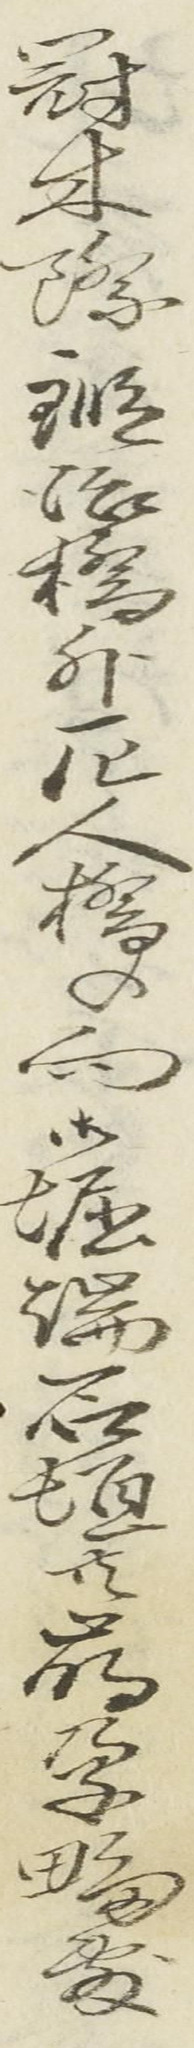冠木際鍛冶橋外役厄人橋の向御堀端石垣共崩孕夥敷
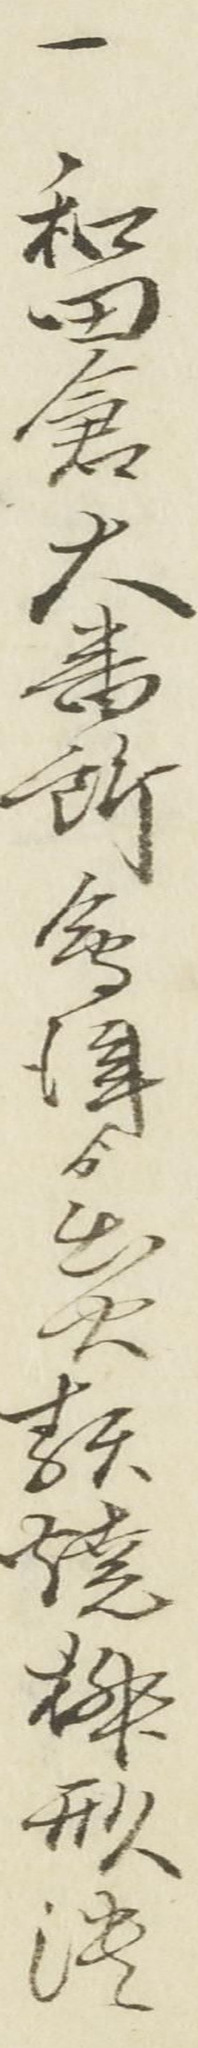一和田倉大番所会津ゟ出火枡形潰
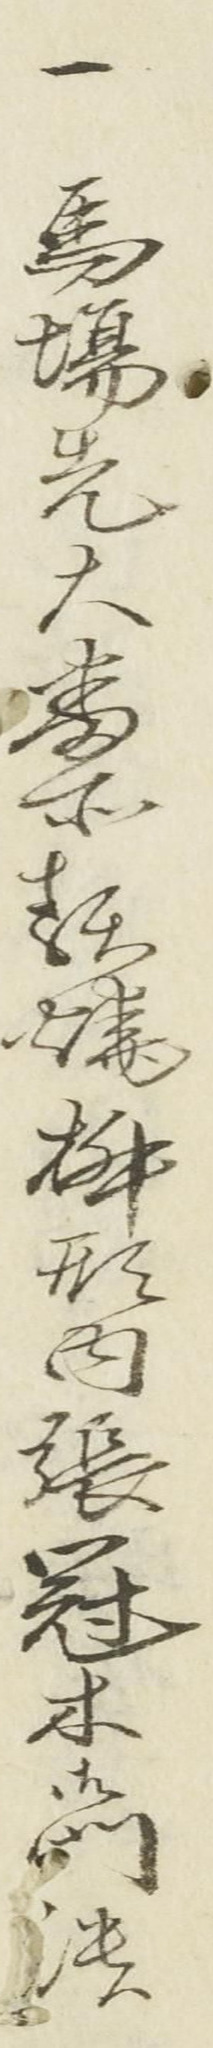一馬場先大番所類焼枡形内張冠木御門潰
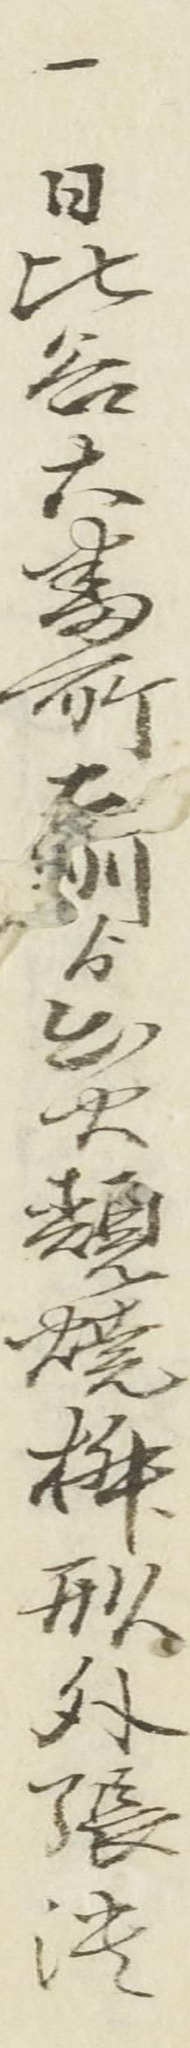一日比谷大番所土州ゟ出火類焼枡形外張潰
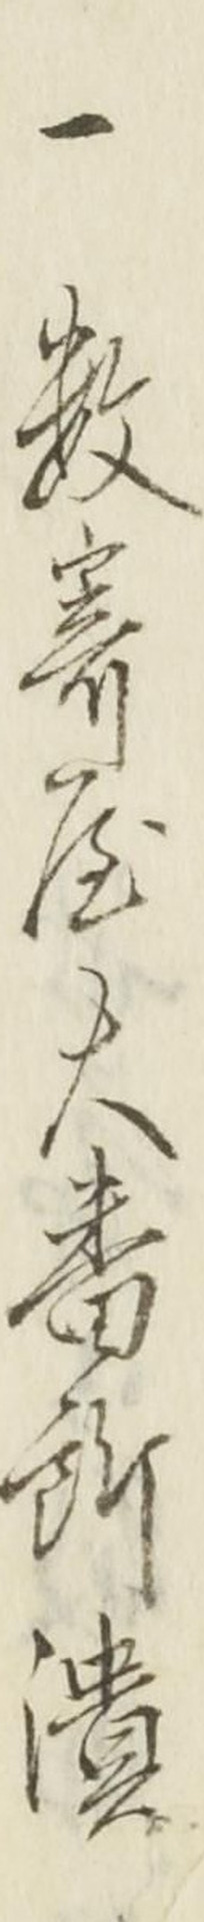一数寄屋大番所潰
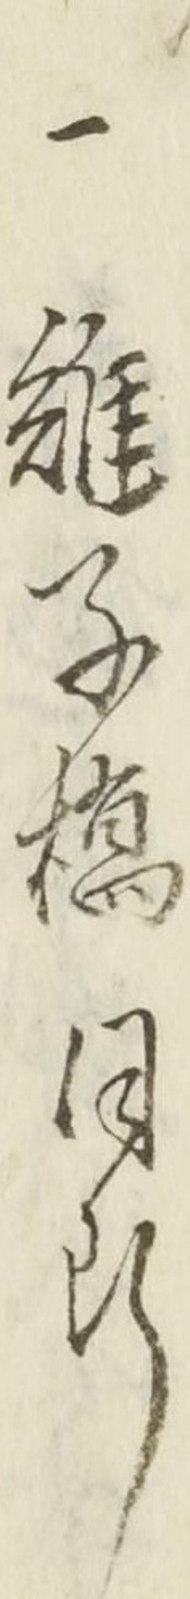一雉子橋同断
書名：安政二乙卯年十月二日大地震之事
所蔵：東京大学地震研究所図書室 Earthquake Research Institute Library, The University of Tokyo, JAPAN
